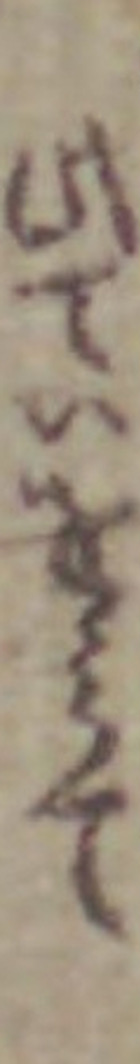此ていをみて
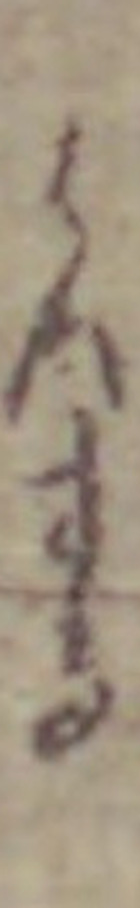はんする
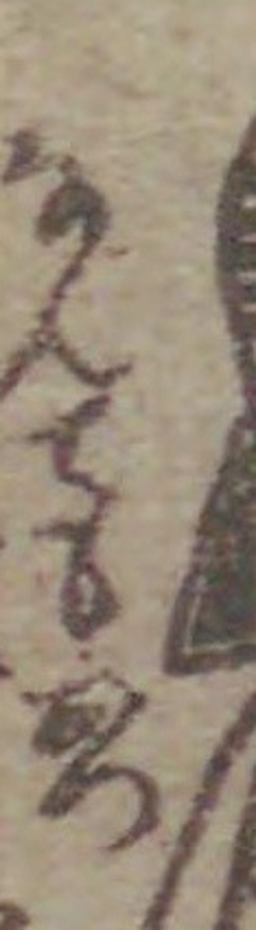なんてもおつ

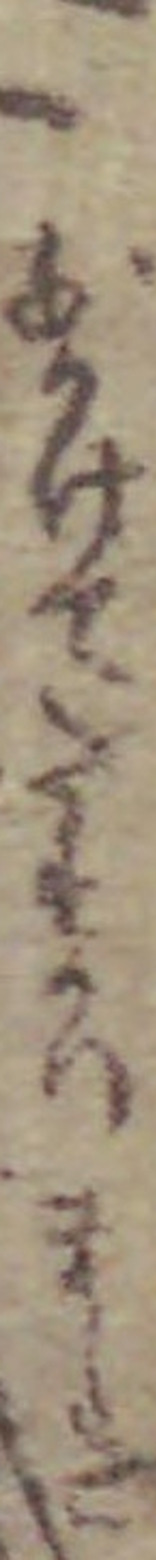おかけてたすかりました
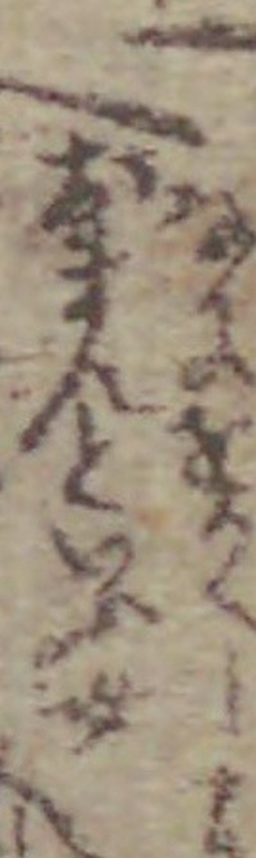おまんといふ女
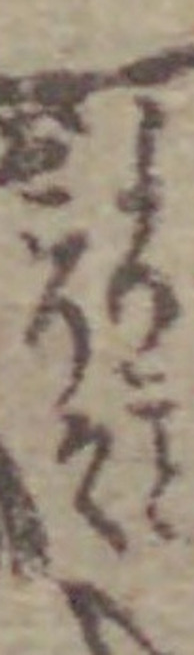おこりかく
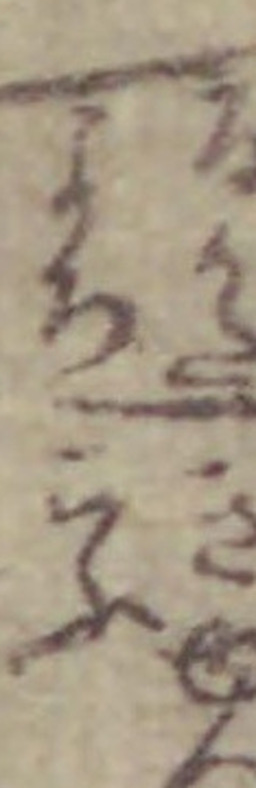よろこふ
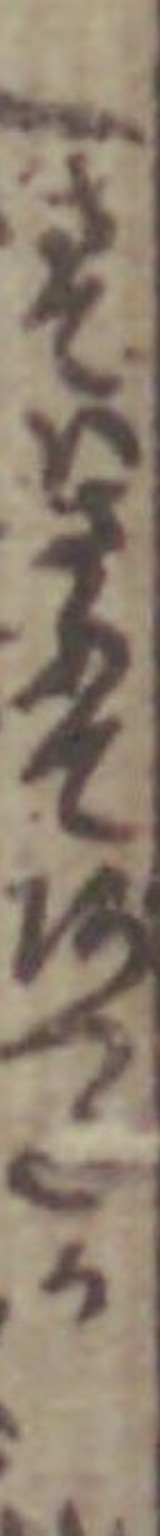さてはさふてあつたか
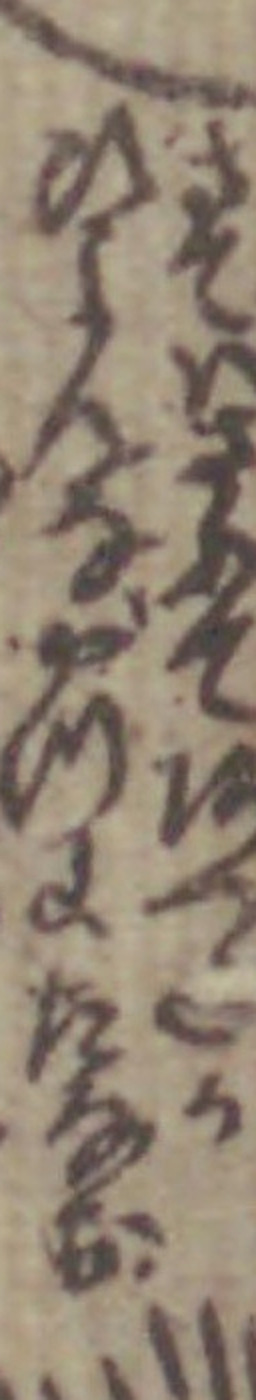ひよんなやつにたなお
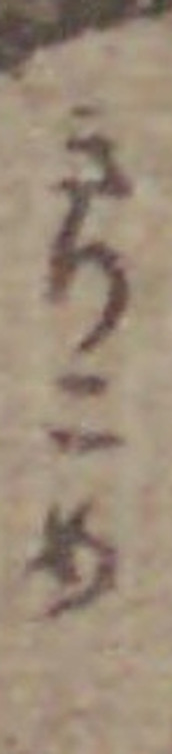きりこめ
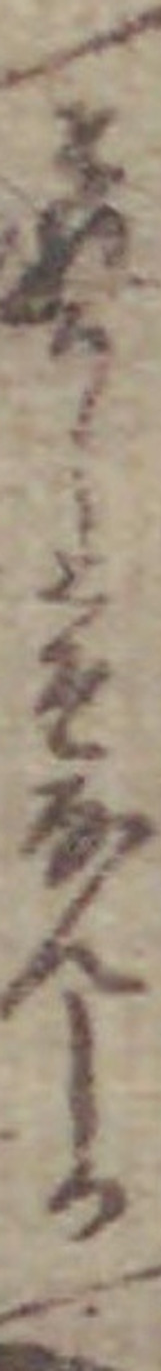それかしこそなんしが
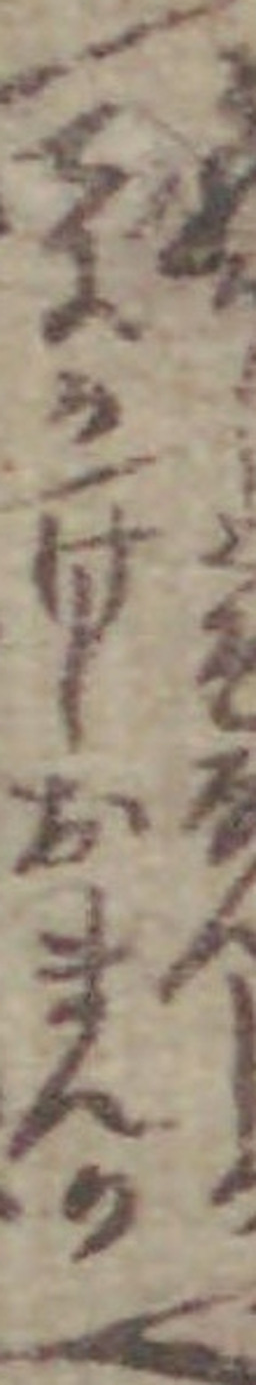てにかけしおまんか
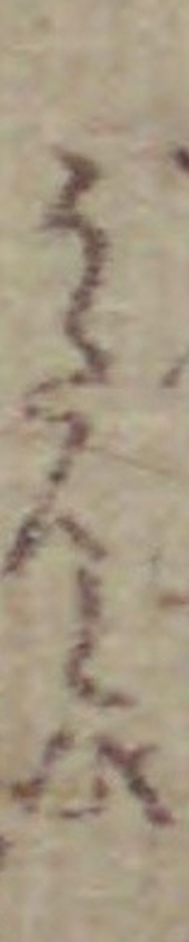うたんと此

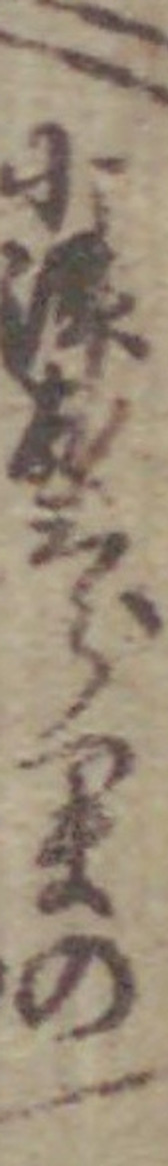小津友三郎つまの
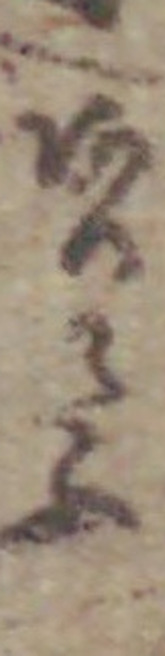ありかたふ
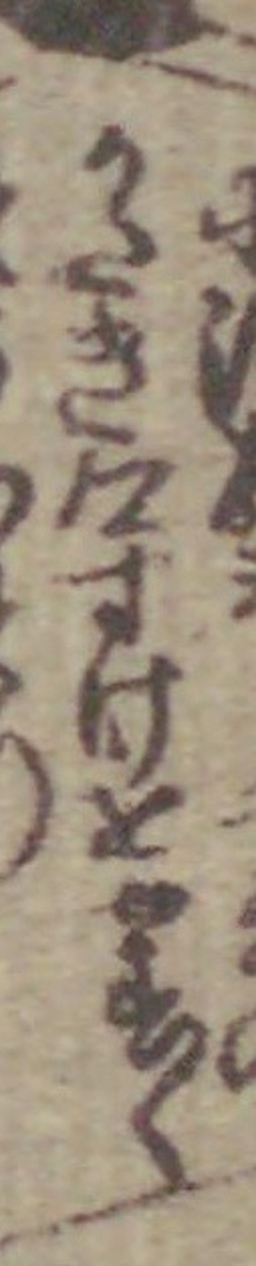かたき郷すけをやす〳〵
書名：化物一家髭女 2巻
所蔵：国立国会図書館 National Diet Library, JAPAN
